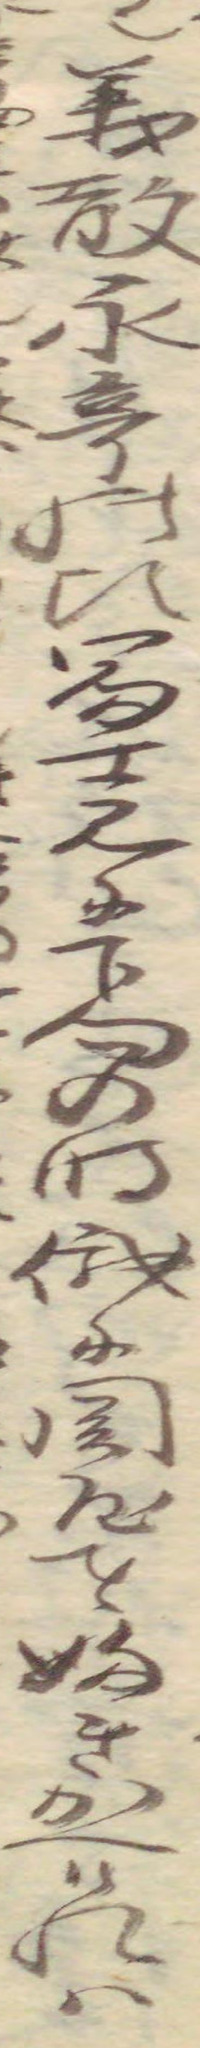義教永享の頃冨士見に下向の時俄に関屋をふきかへけれは
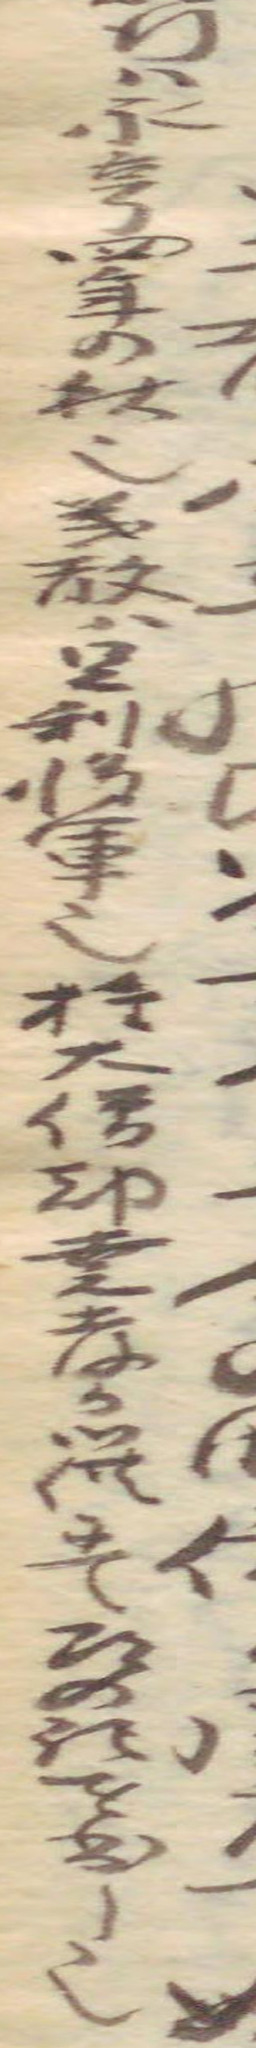此紀行は永享四年の秋也義教は足利将軍也権大僧都尭孝か御供にて道の記を書し也

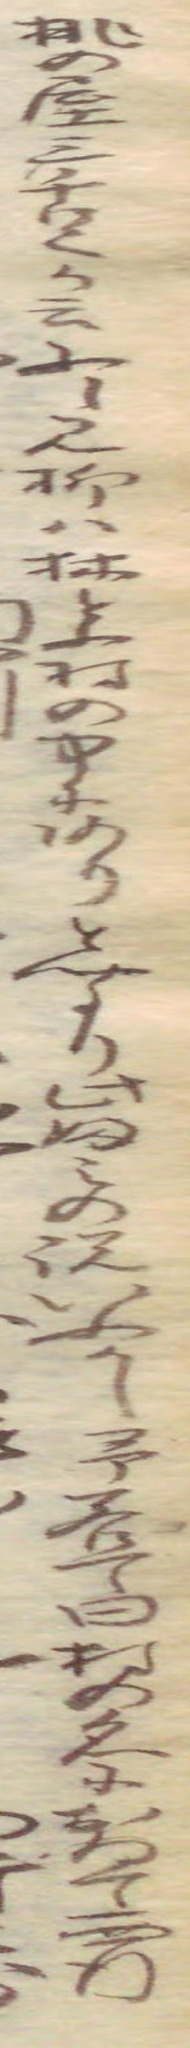桃の屋三千足か云ふし見柳は林とふ？村の中にありと聞り此ふみの説いふかし予答て曰村の名におゐて西行法師か
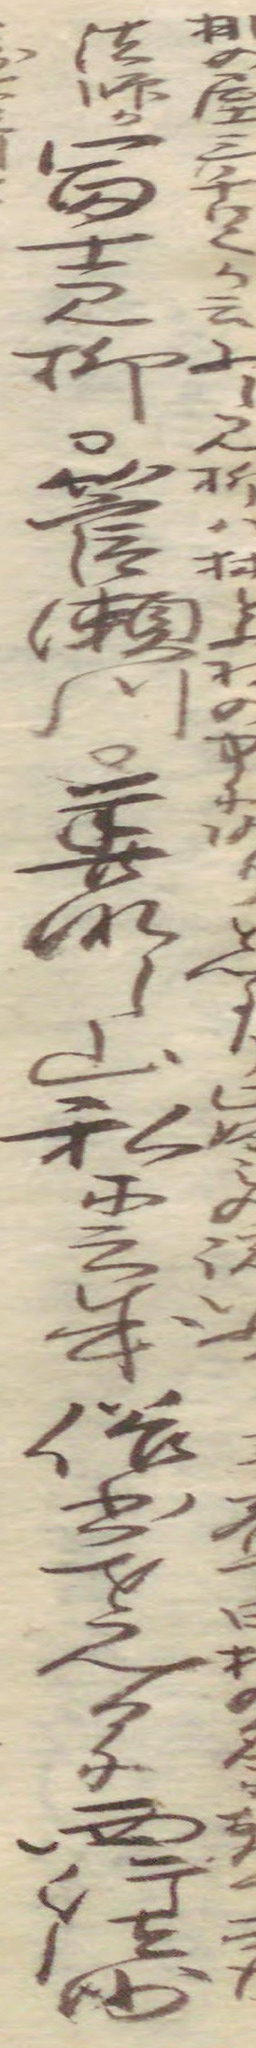冨士見柳○菅瀬川○華なし山私に云或俗書を見るに西行法師
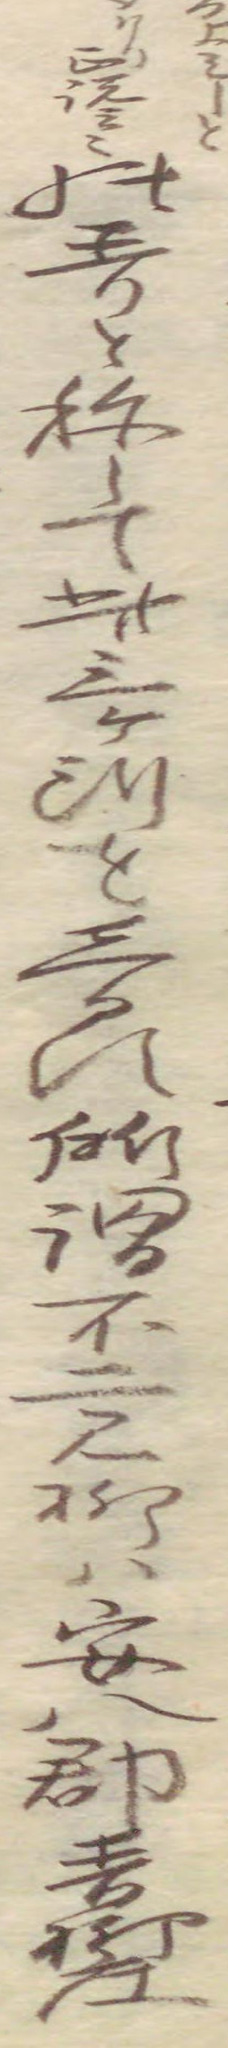の歌と称して此三ヶ所をしるす所謂不二見柳は安八郡青柳庄
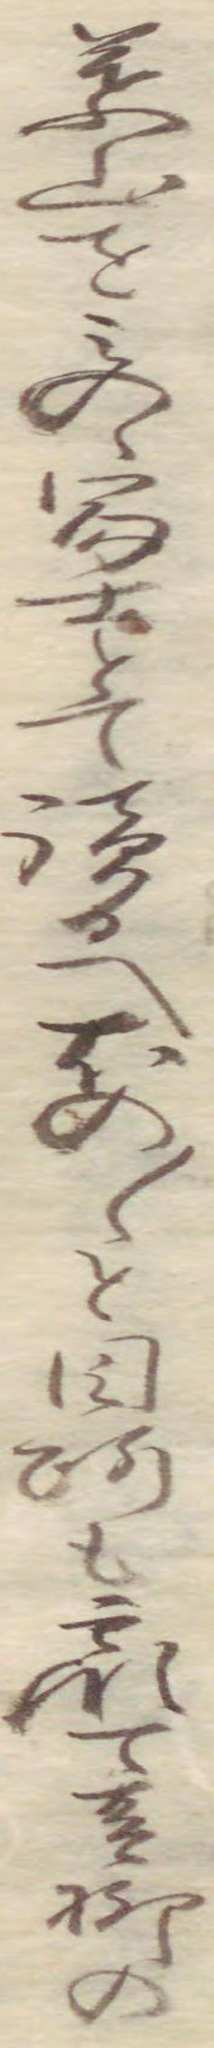葉山をみのゝ富士とて読る〽ほの〳〵と目路も忘れて青柳の
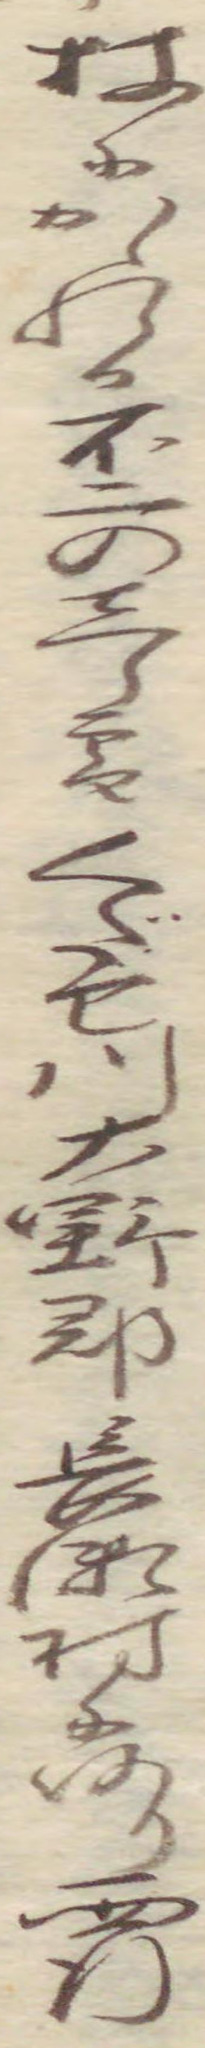村にかゝれる不二のしら雪くだせ川大野郡長瀬村にあり西行
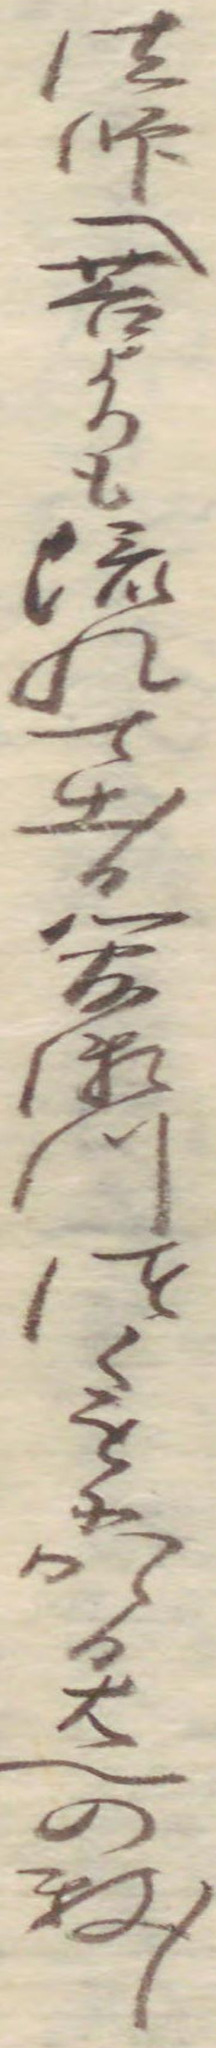法師〽苔よりも流れて出る管瀬川つくもにかゝるはへの数〳〵
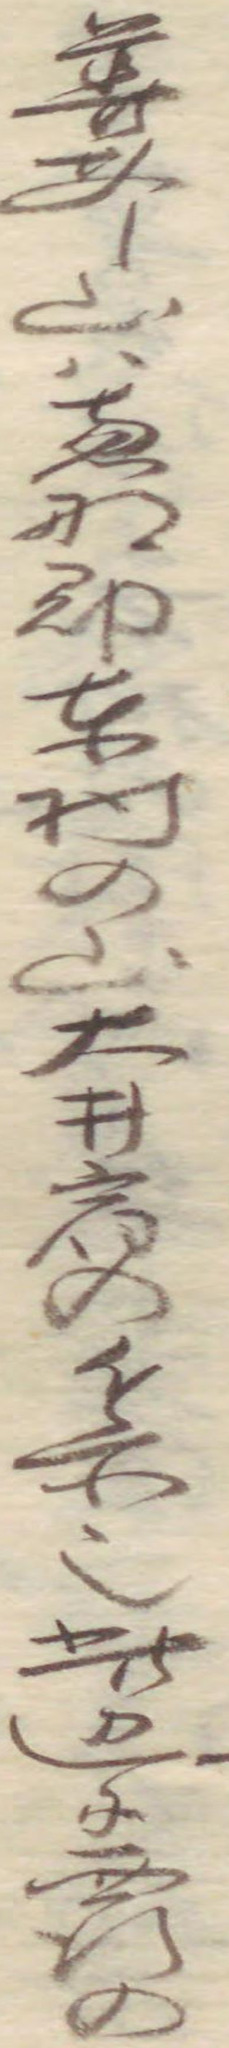華なし山は恵那郡東村の山大井宿の近所也此辺に西行の
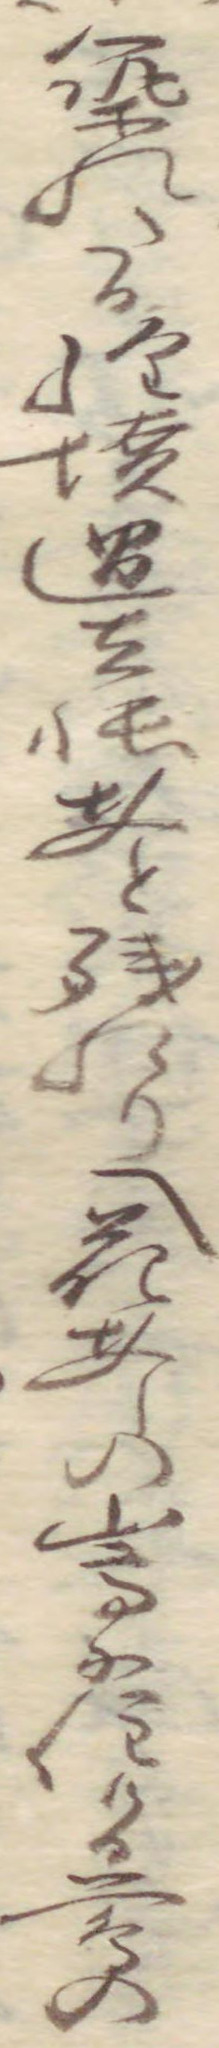築れたる経墳過去帳なと残れり〽花なしの嵩に住ける鶯の
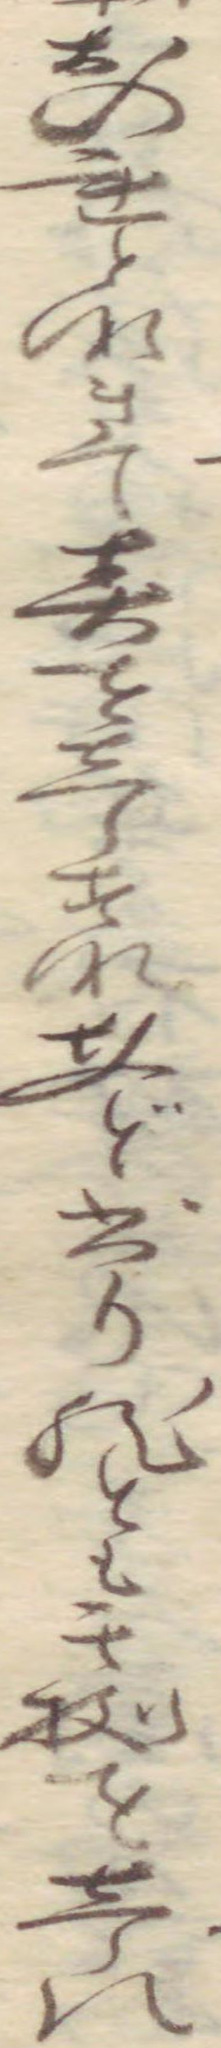おのれとなきて春をしらすななど書り然れとも其拠をしらす
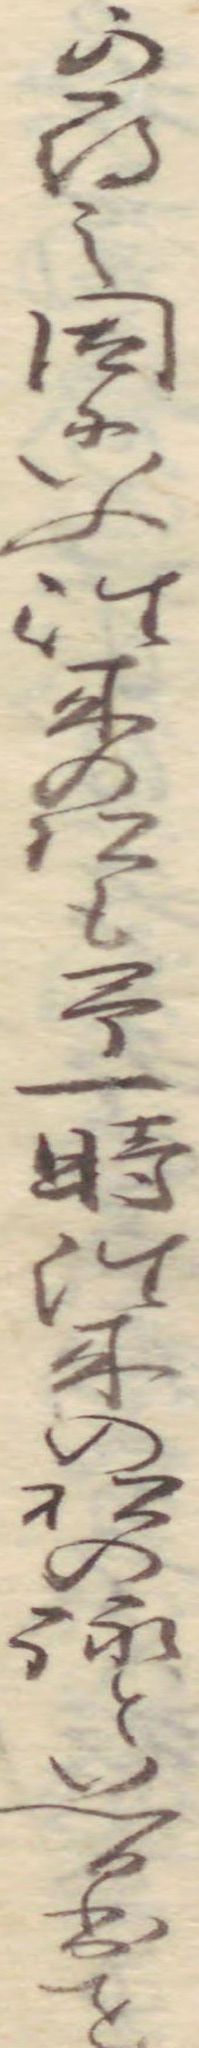可尋之因にいふ往来の松も予一時往来の松の詠といへる書を
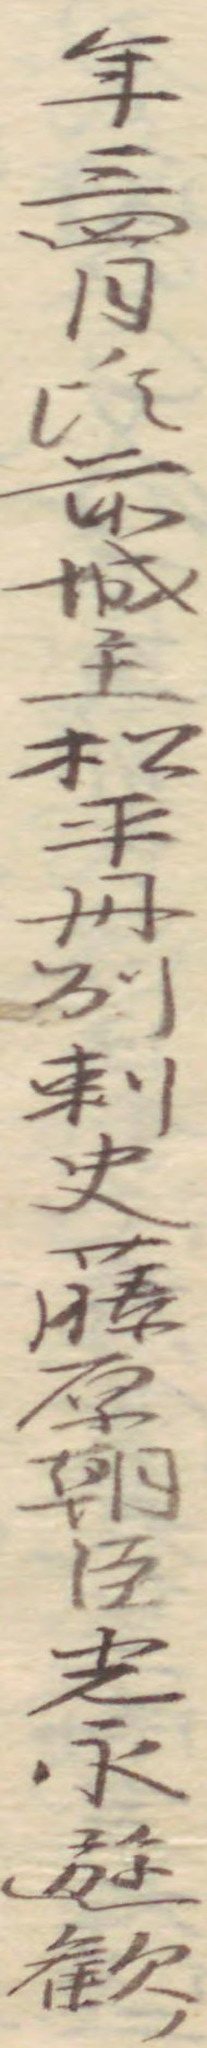年三四月ノ頃前城主松平丹州剌史藤原朝臣光永遊歓
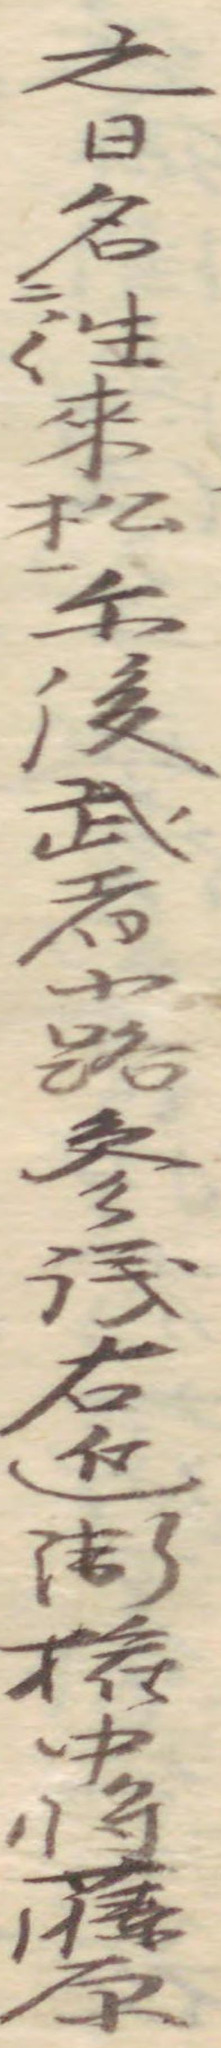之日名往来松尓後武者小路参議右近衛権中将藤原
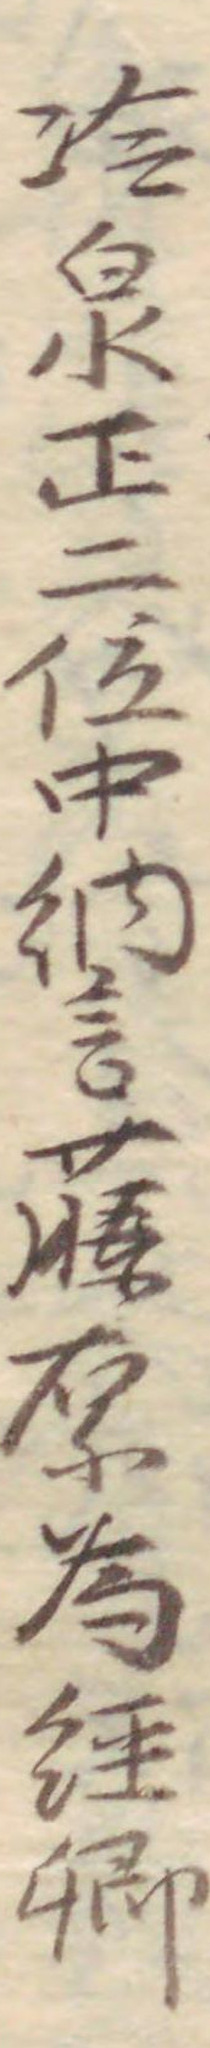冷泉正二位中納言藤原為経卿
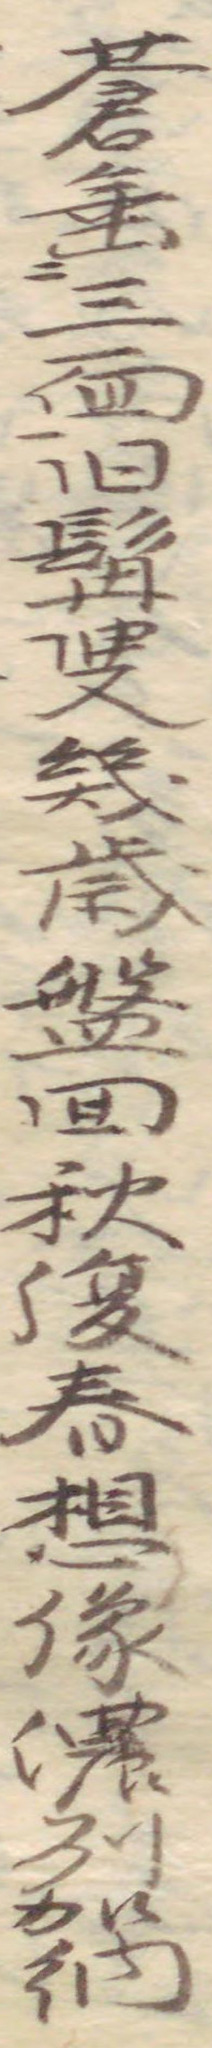蒼垂三面旧髯叟幾歳盤回秋復春想像濃州加納
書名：鶯宿雑記. 巻263-264
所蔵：国立国会図書館 National Diet Library, JAPAN
